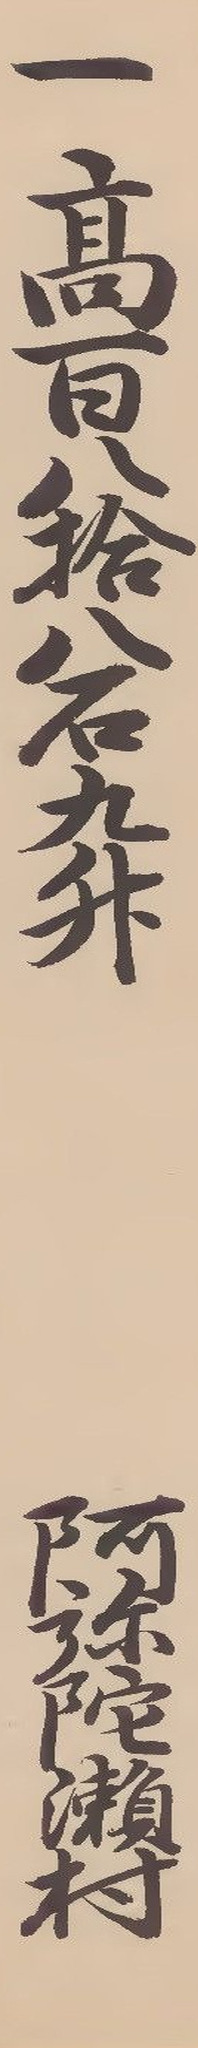一高百八拾八石九升阿弥陀瀬村
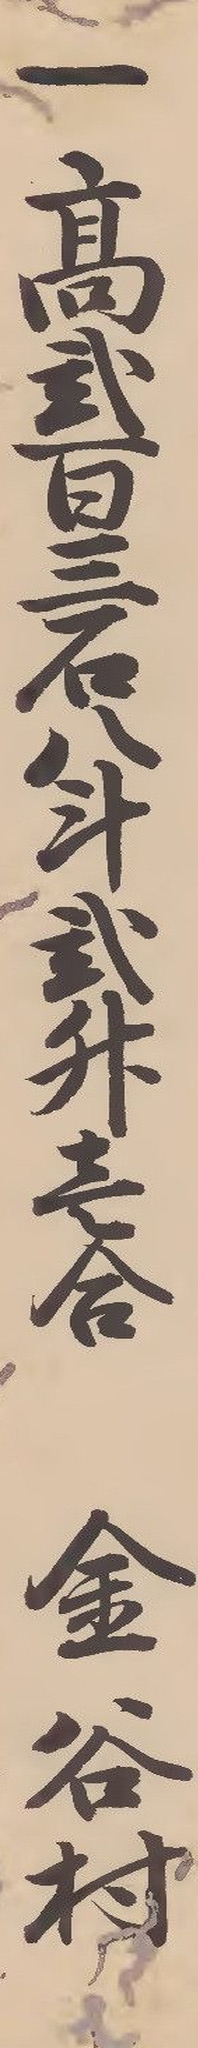一高弐百三石八斗弐升壱合金谷村

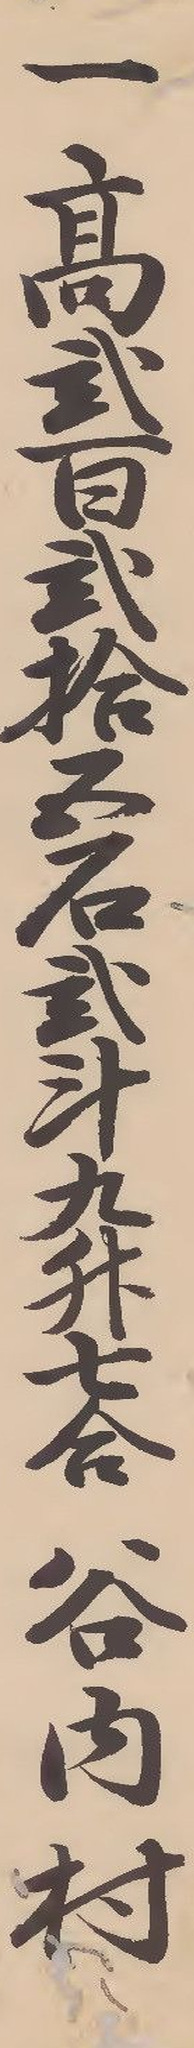一高弐百弐拾五石弐斗九升七合谷内村
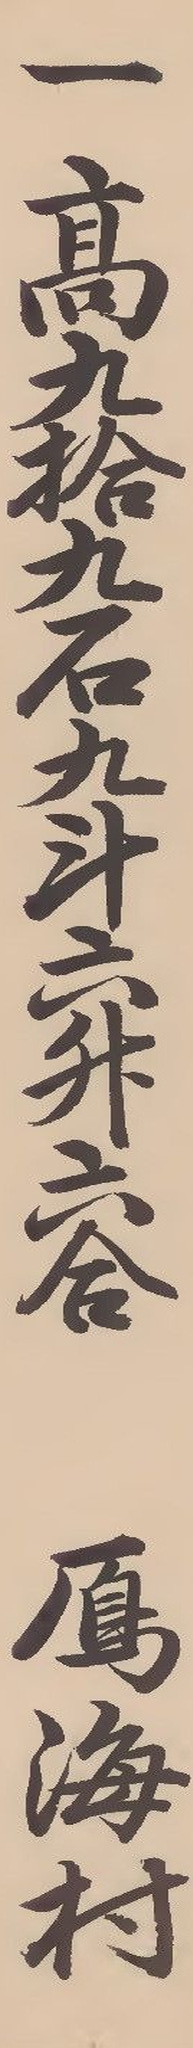一高九拾九石九斗六升六合雁海村
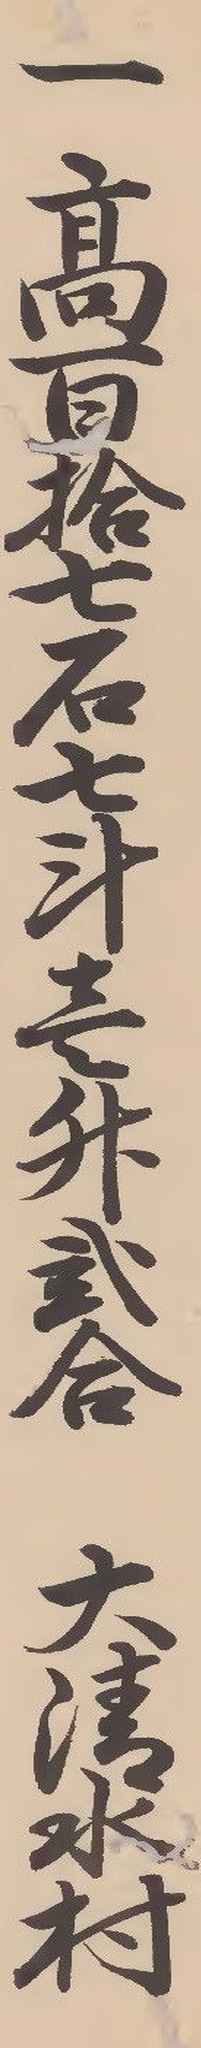一高百拾七石七斗壱升弐合大清水村
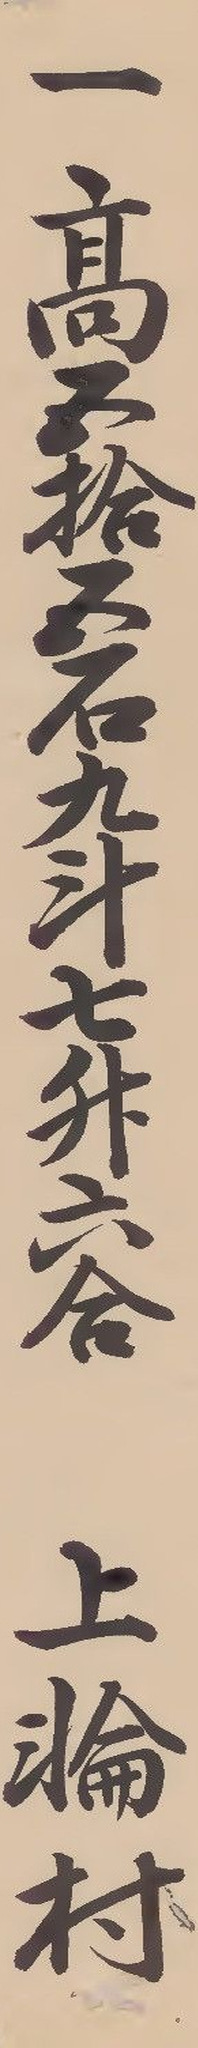一高五拾五石九斗七升六合上輪村
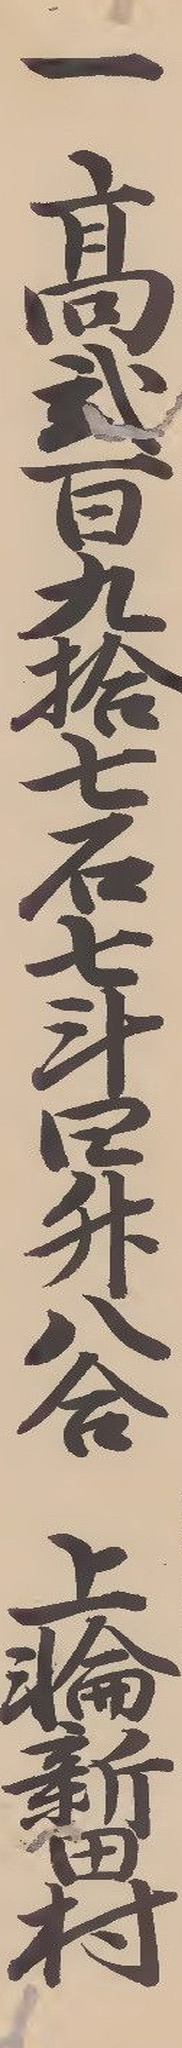一高弐百九拾七石七斗四升八合上輪新田村
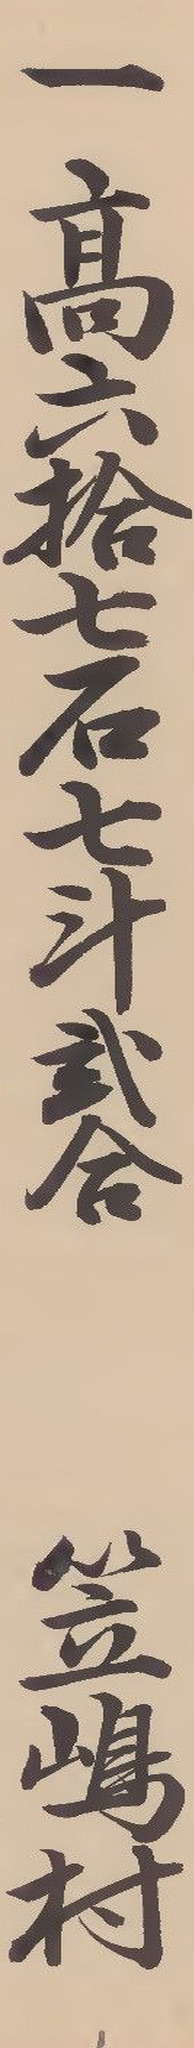一高六拾七石七斗弐合笠島村
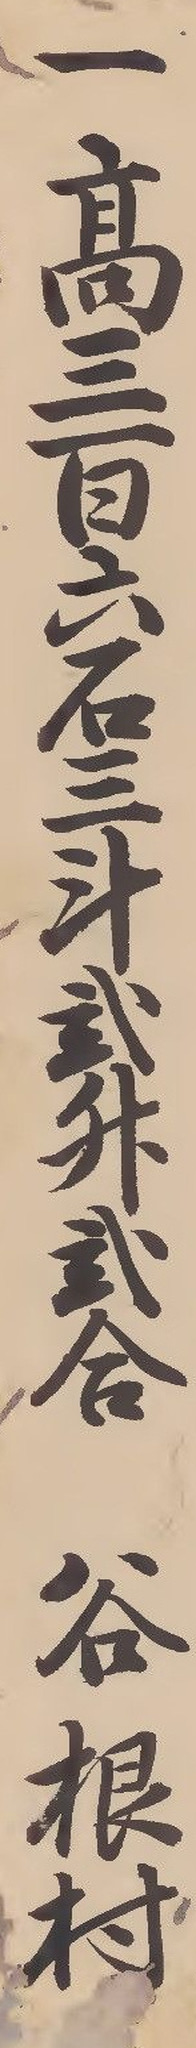一高三百六石三斗弐升弐合谷根村

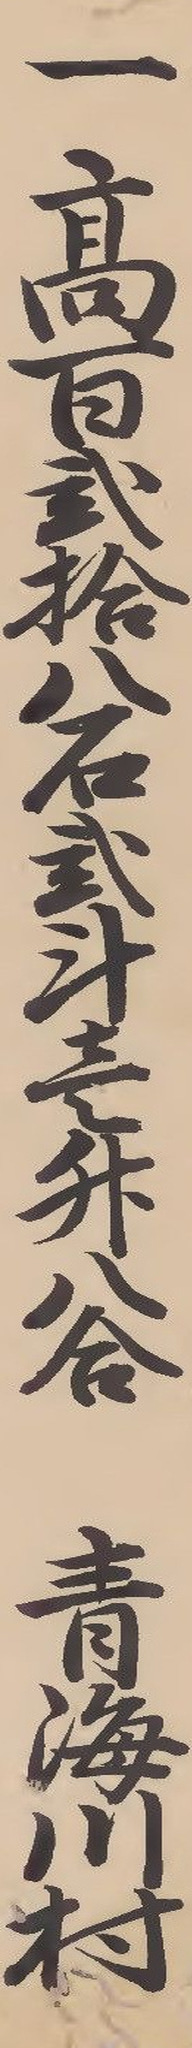一高百弐拾八石弐斗壱升八合青海川村
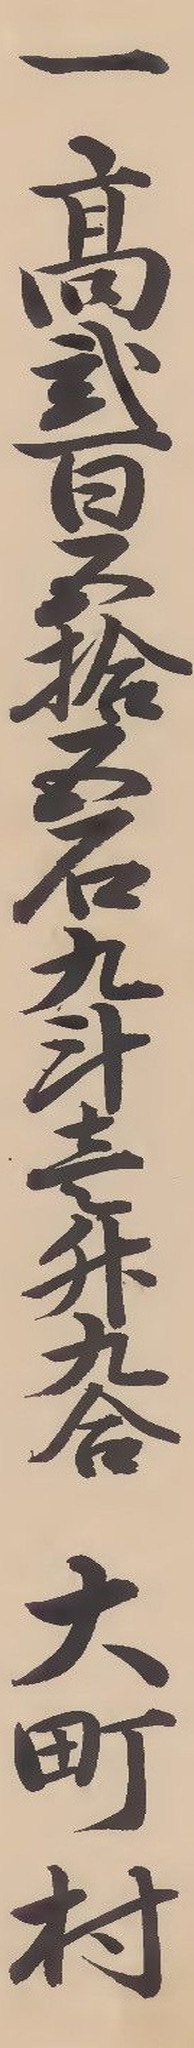一高弐百五拾五石九斗壱升九合大町村
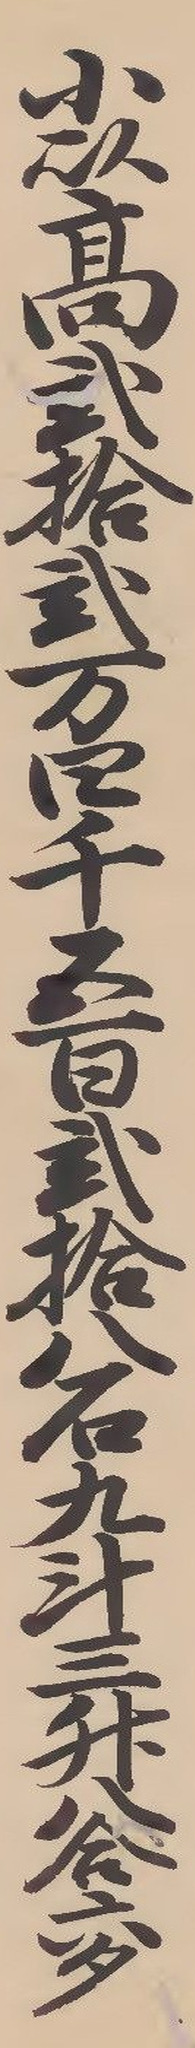小以高弐拾弐万四千五百弐拾八石九斗三升八合六勺
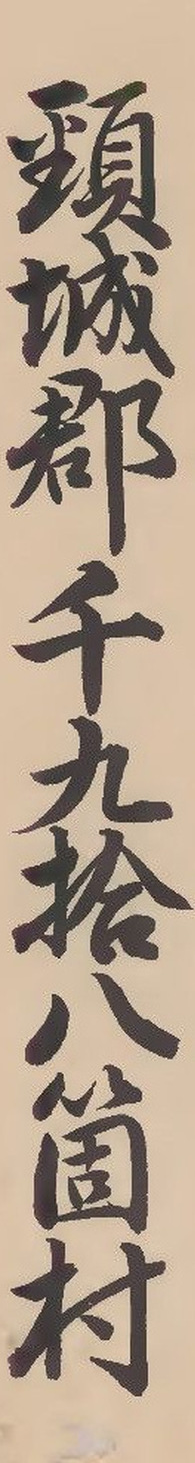頚城郡千九拾八箇村
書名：越後国郷帳　上
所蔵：国立公文書館 National Archives of Japan
